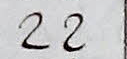22
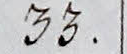33.
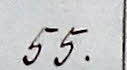55.
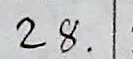28.
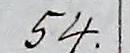54.
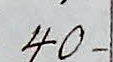40
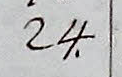24.
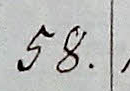58.
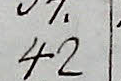42
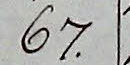67.
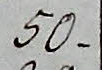50
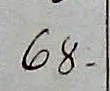68
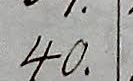40.
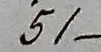51
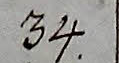34.
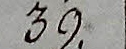39.
